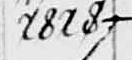2828
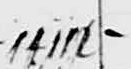14112
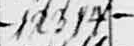12314
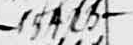15423
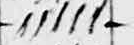11111
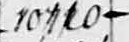10720
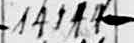14144
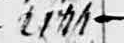2177
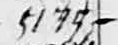5175
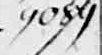908
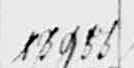13955
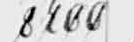8166
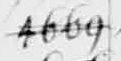4669
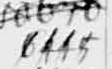6445
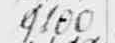9100
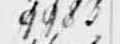9983
